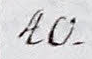40
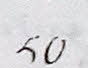50
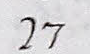27
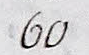60
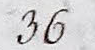36
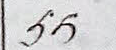55
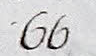66
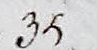35
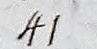41
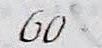60
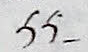55
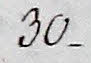30
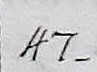47
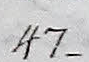47
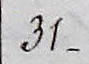31
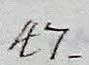47
